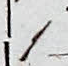1
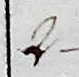2
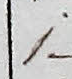1
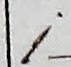1
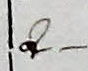2
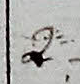2
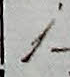1
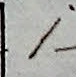1
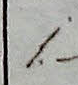1.
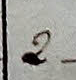2
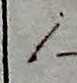1
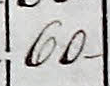60
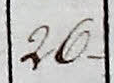26
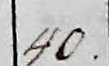40
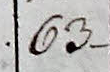63
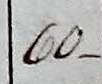60
